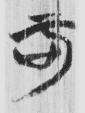可
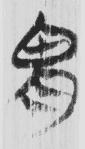胃
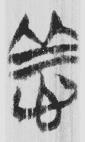恙
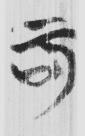可
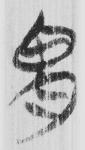胃
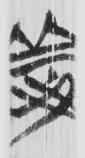義
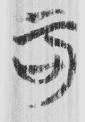可
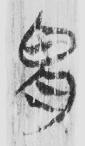胃
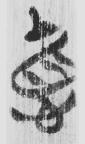惪
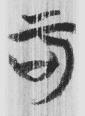可
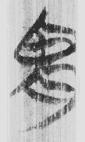胃
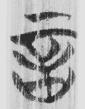音
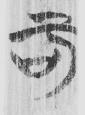可
